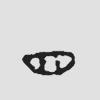四
